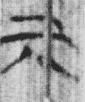亓（其）
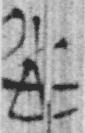○（過）
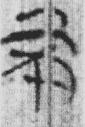不
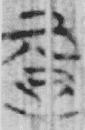亞（惡）
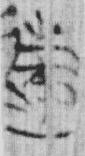速
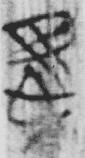悔（謀）
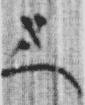之
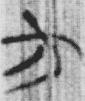方
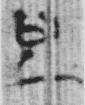也
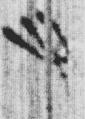又（有）
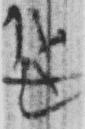○（過）
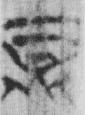鼎（則）
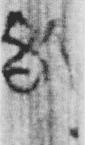咎
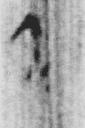人
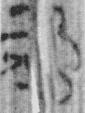不
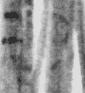○（慎）
